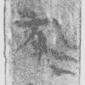九十=
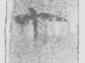七
